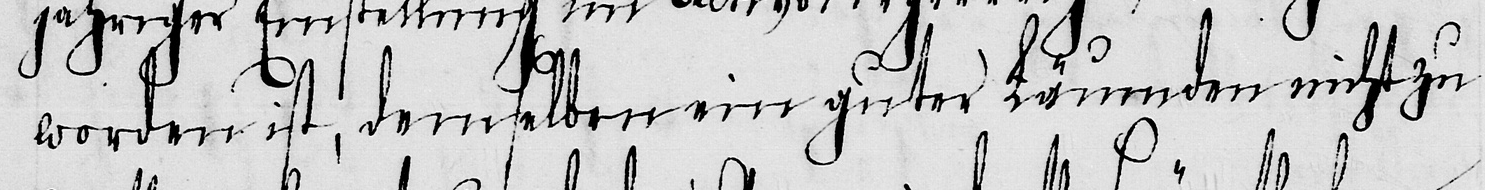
worden ist, demselben ein guter Läumden nicht zu
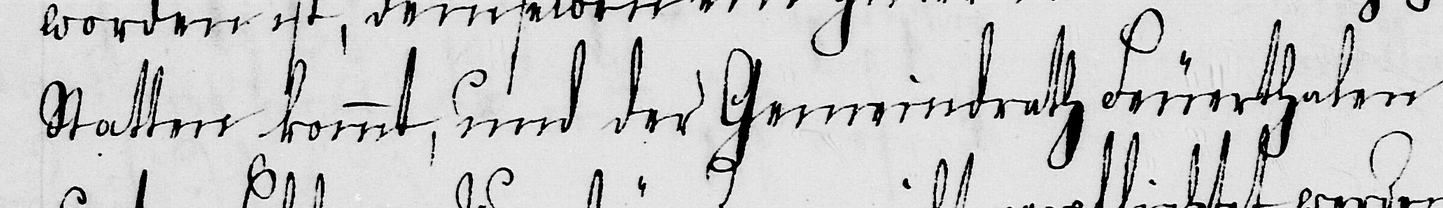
Statten kommt, und der Gemeindrath Feuerthalen
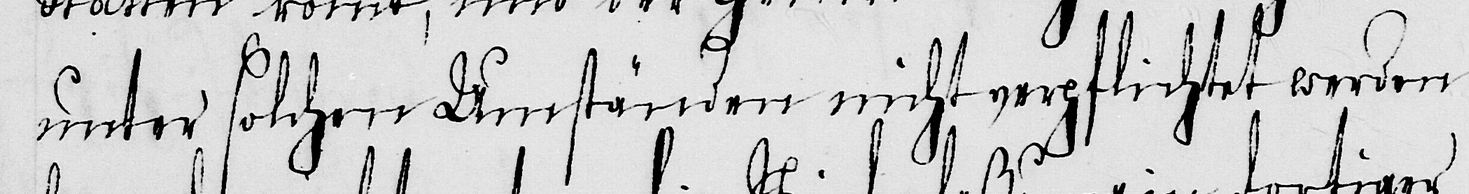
unter solchen Umständen nicht verpflichtet werden
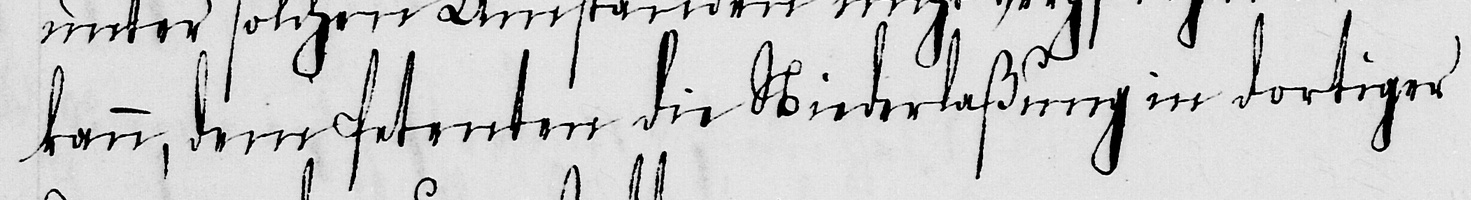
kann, dem Petenten die Niederlaßung in dortiger
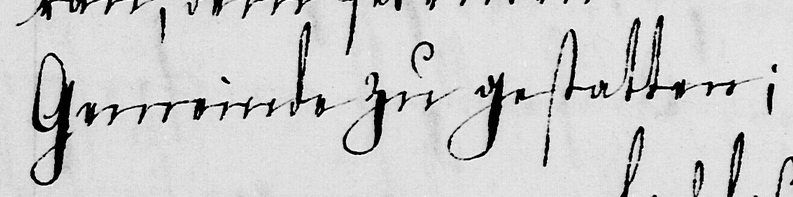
Gemeinde zu gestatten;
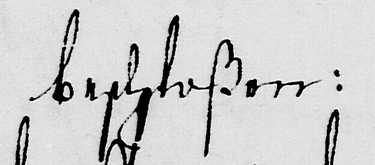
beschloßen:
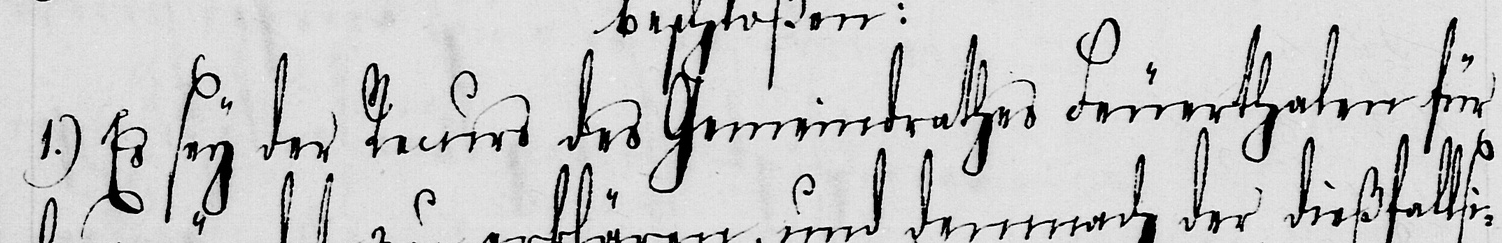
Es sey der Recurs des Gemeindrathes Feuerthalen für
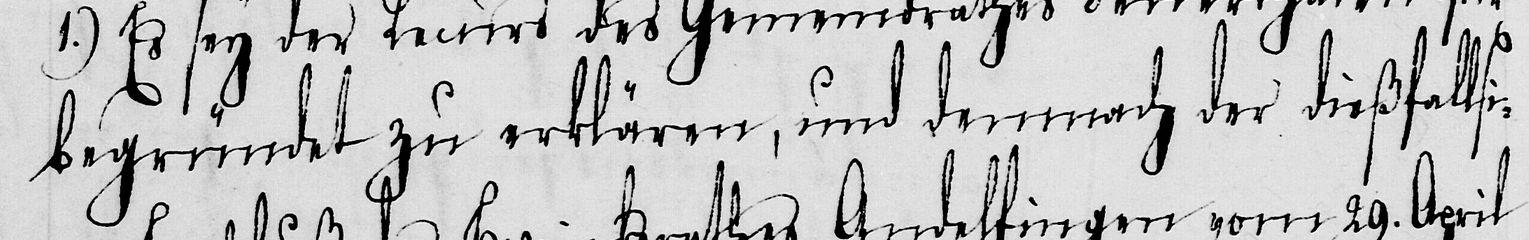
begründet zu erklären, und demnach der dießfall¬
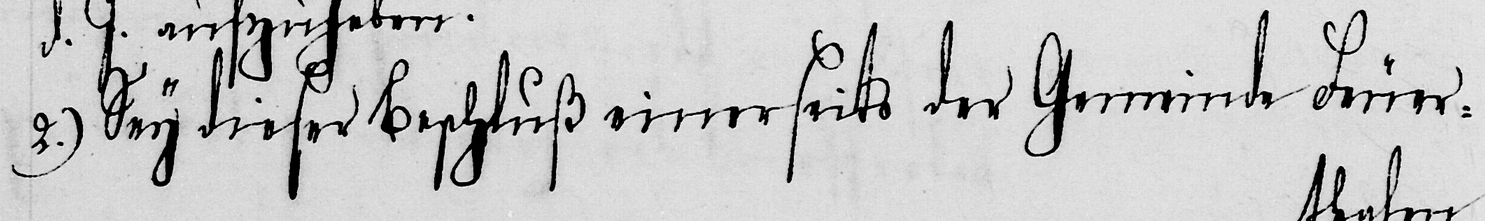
2.) Sey dieser Beschluß einerseits der Gemeinde Feuer-
